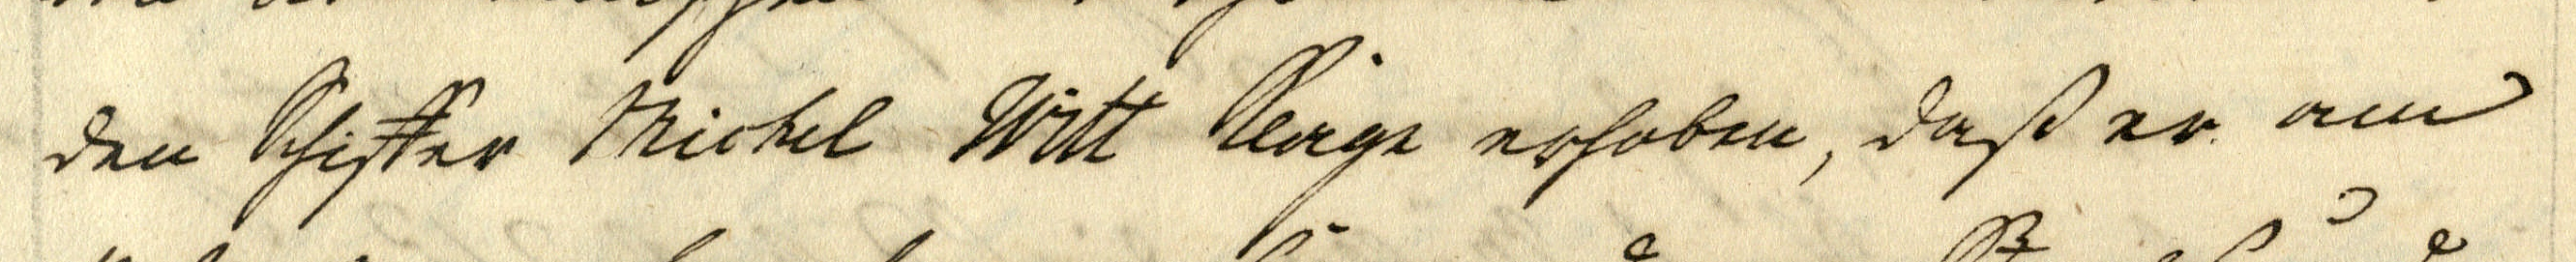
den Schiffer Michel Witt Klage erhoben, daß er am
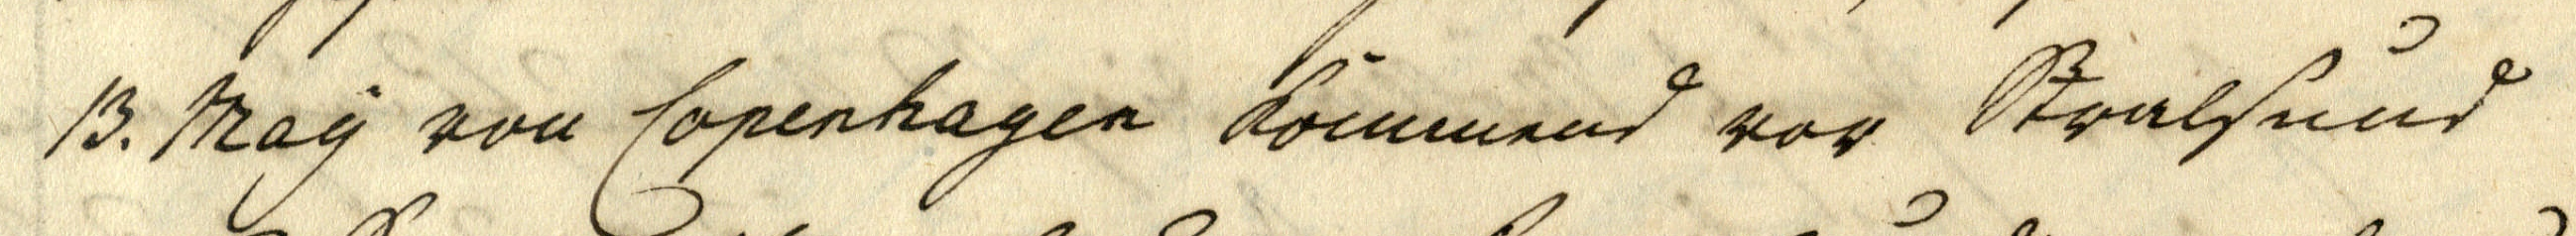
13. May von Copenhagen kommend vor Stralsund
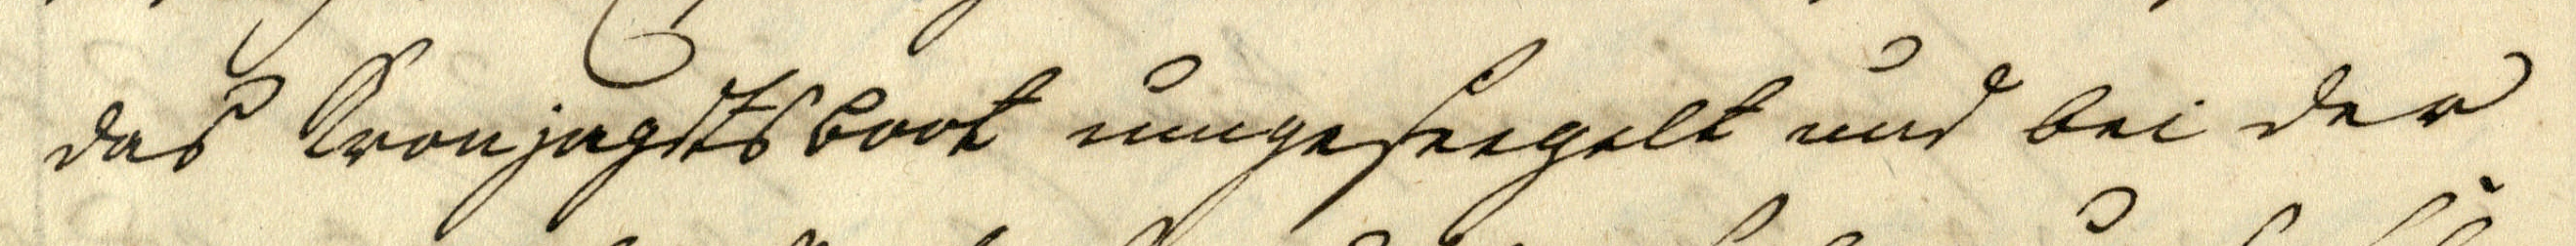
das Kronjagdtsboot umgeseegelt und bei der
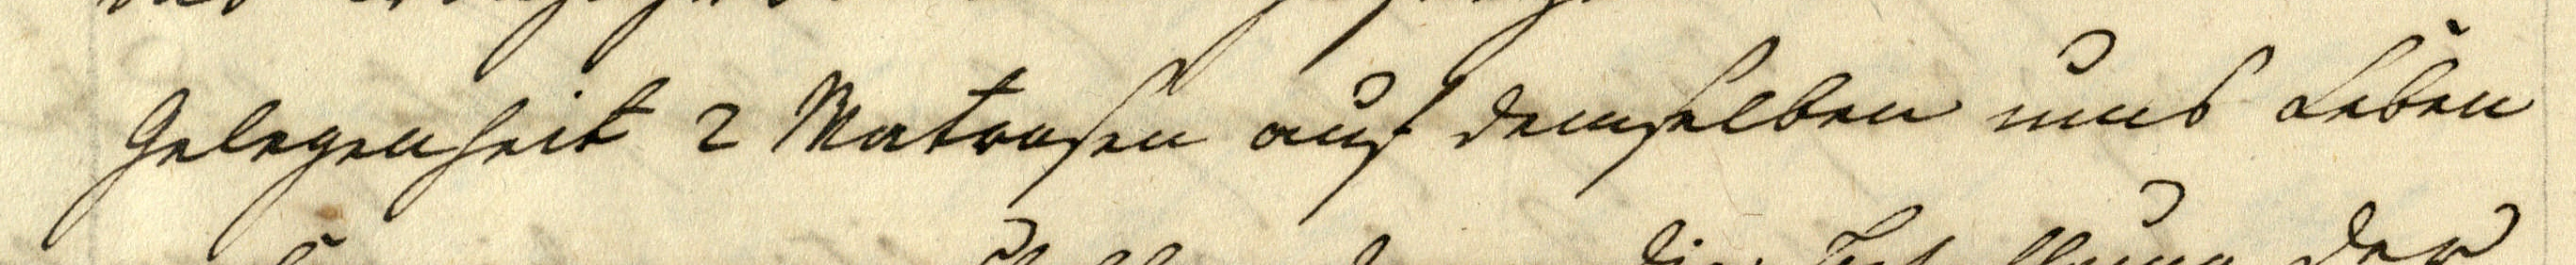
Gelegenheit 2 Matrosen auf demselben ums Leben
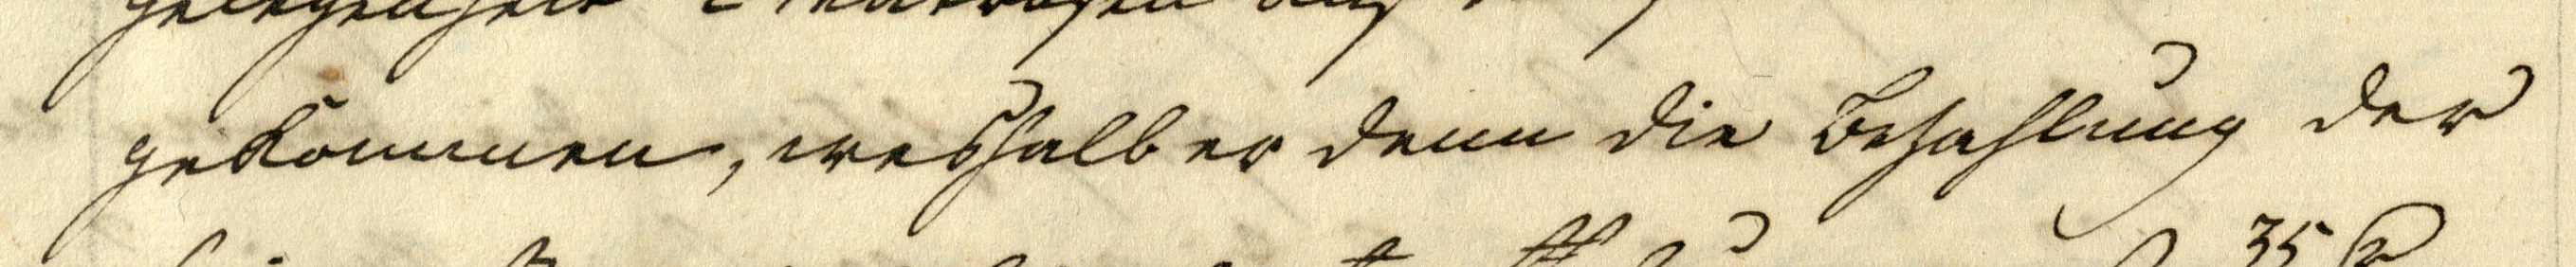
gekommen, weshalb er denn die Bezahlung der
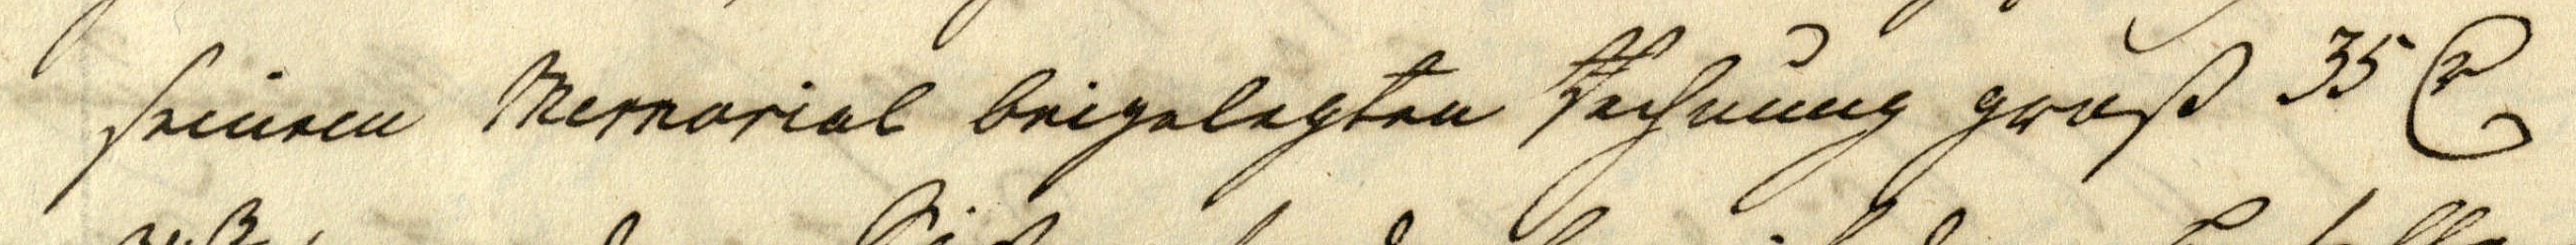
seinem Memorial beigelegten Rechnung groß 35 rtl
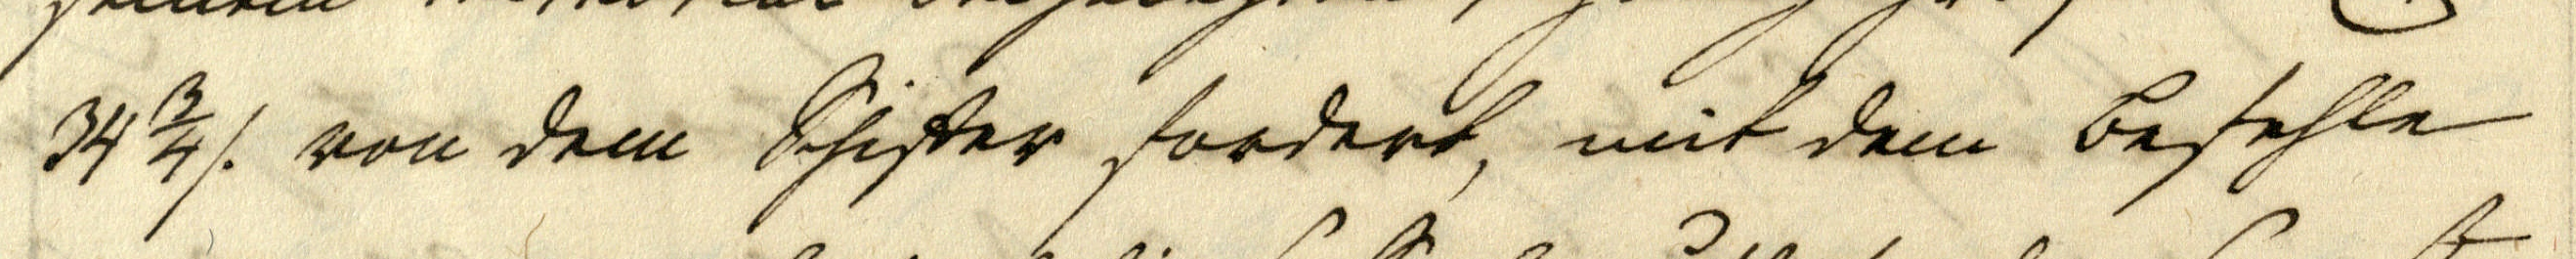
34 3/4 S. von dem Schiffer fordert, mit dem Befehle
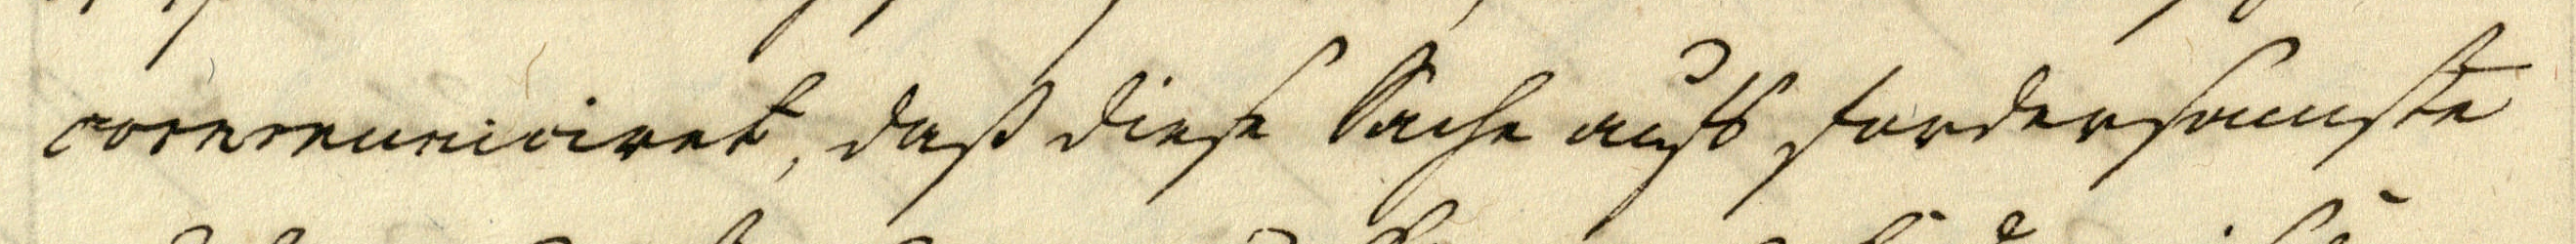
communiciret, daß diese Sache aufs fordersamste
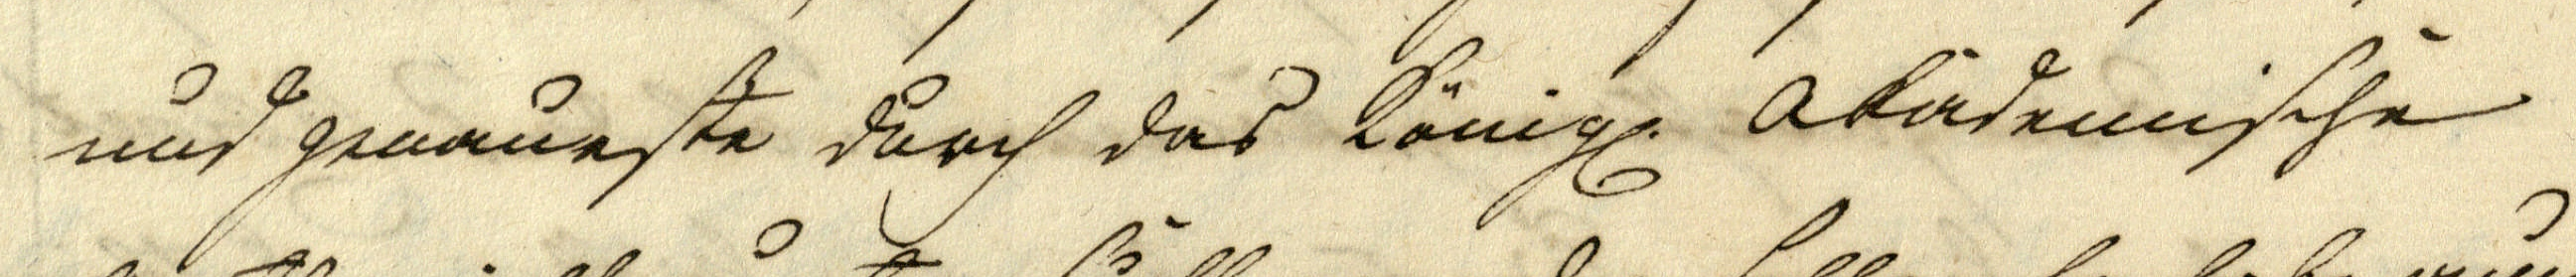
und genaueste durch das Königl. Akademische
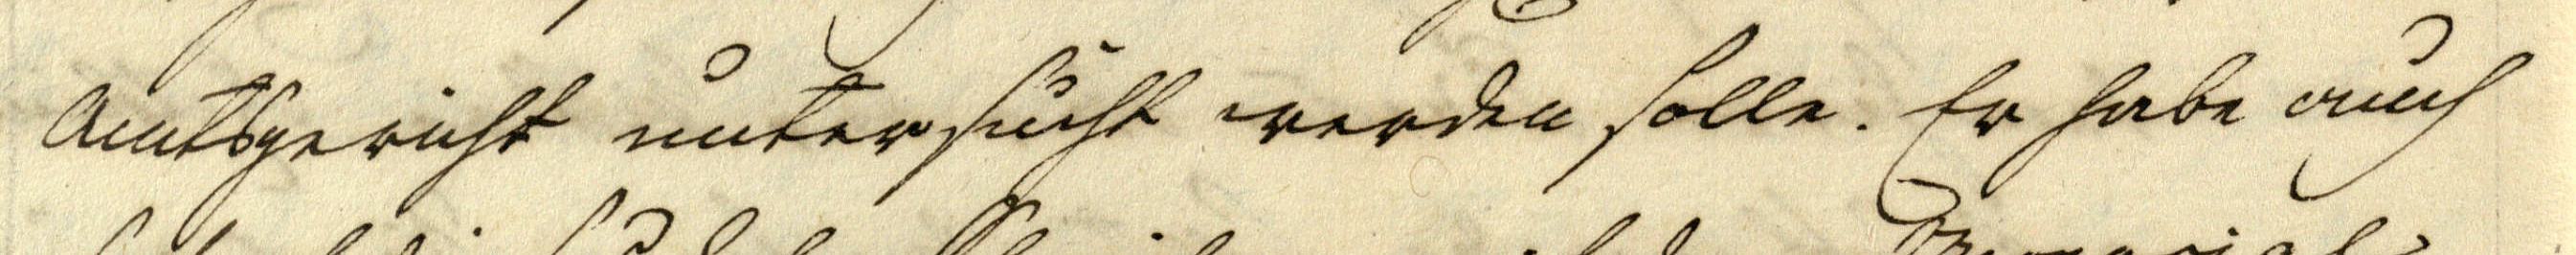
Amtsgericht untersucht werden solle. Er habe auch
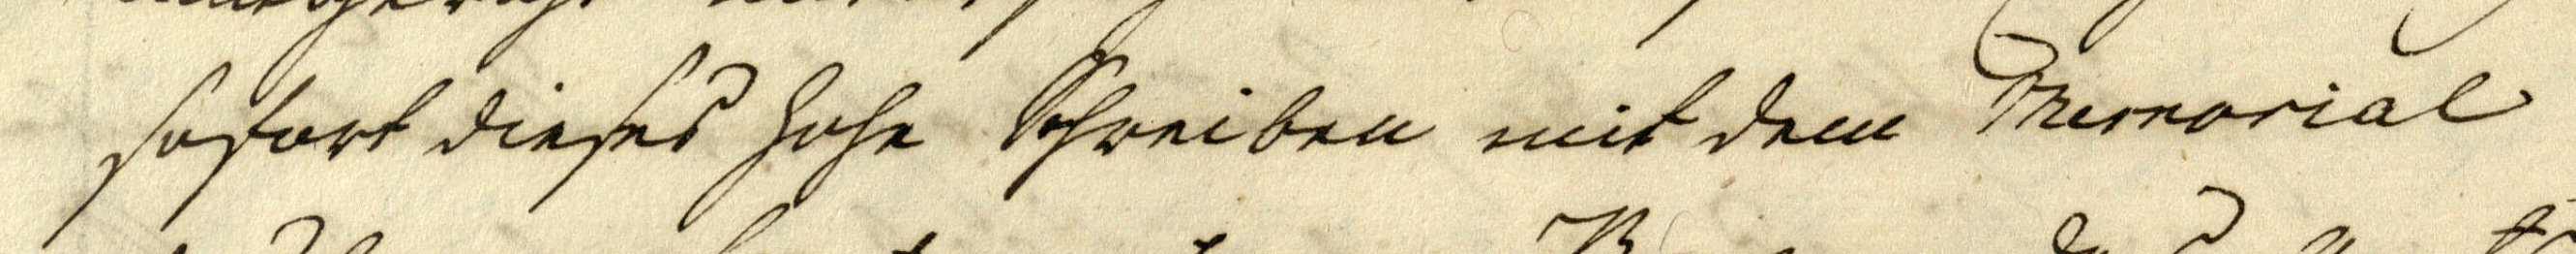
sofort dieses hohe Schreiben mit dem Memorial
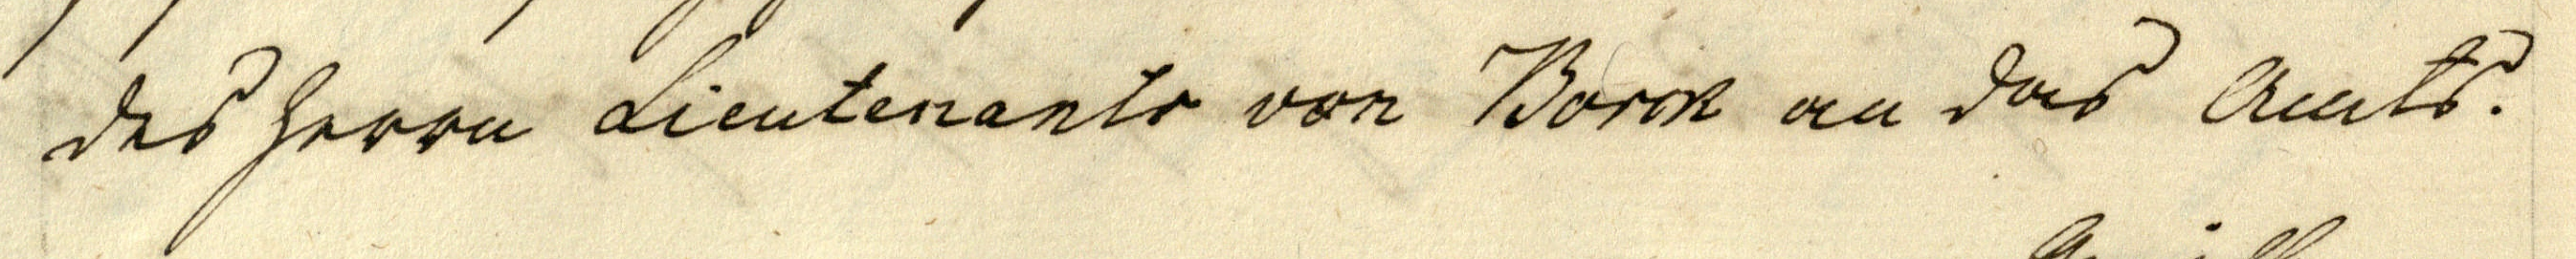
des Herrn Lieutenenats von Borck an das Amts
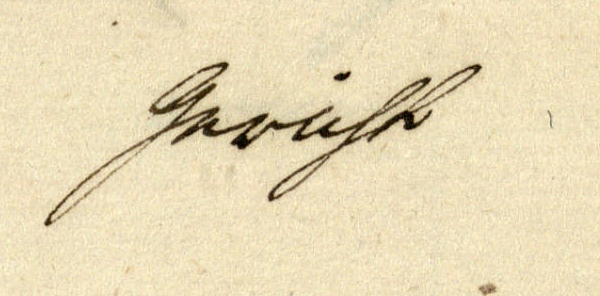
Gericht
